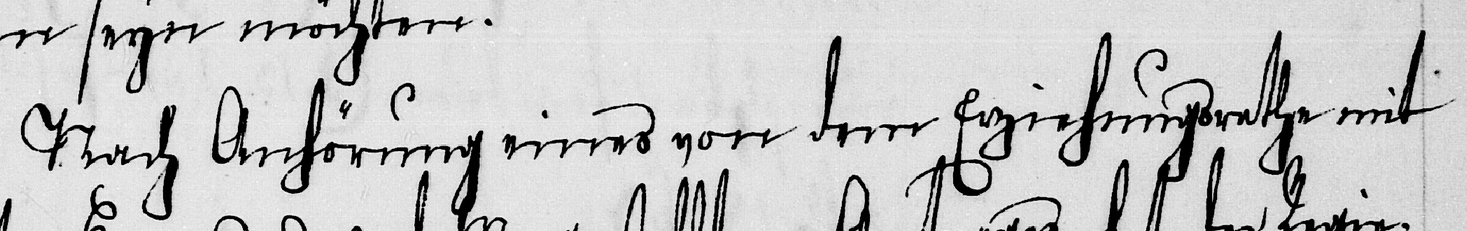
Nach Anhörung eines von dem Erziehungsrathe mit
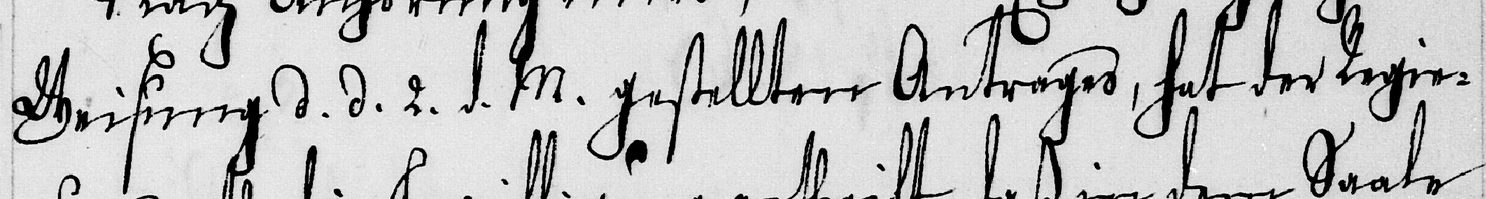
Weisung d. d. 2. d. M. gestellten Antrages, hat der Regie¬
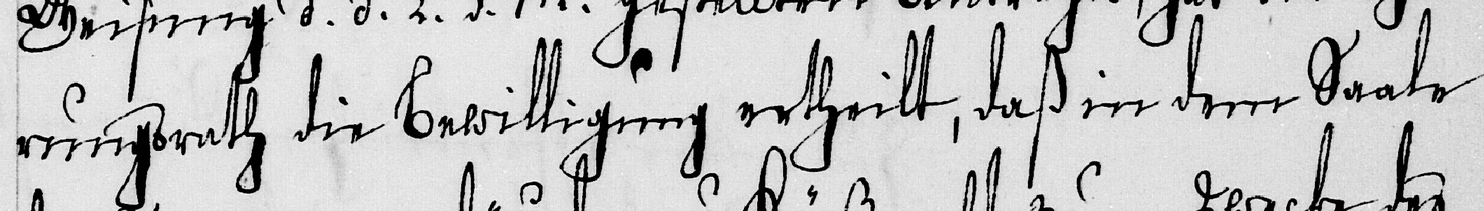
rungsrath die Bewilligung ertheilt, daß in dem Saale
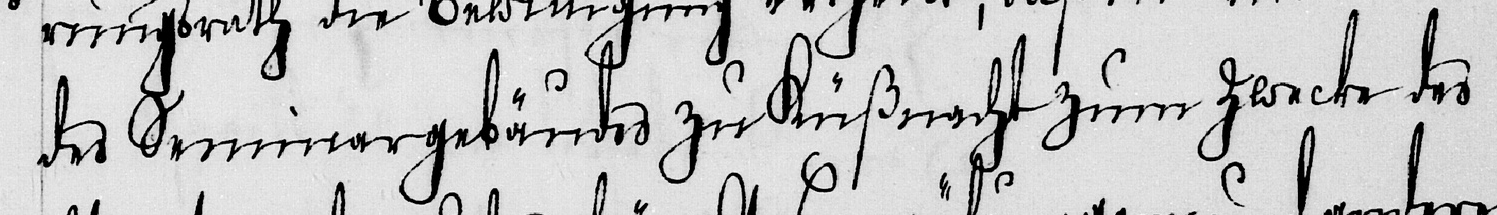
des Seminargebäudes zu Küßnacht zum Zwecke des
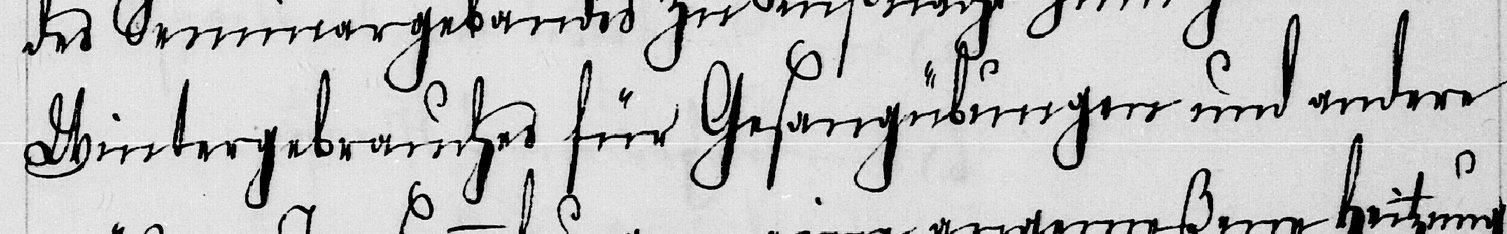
Wintergebrauches für Gesangübungen und andere
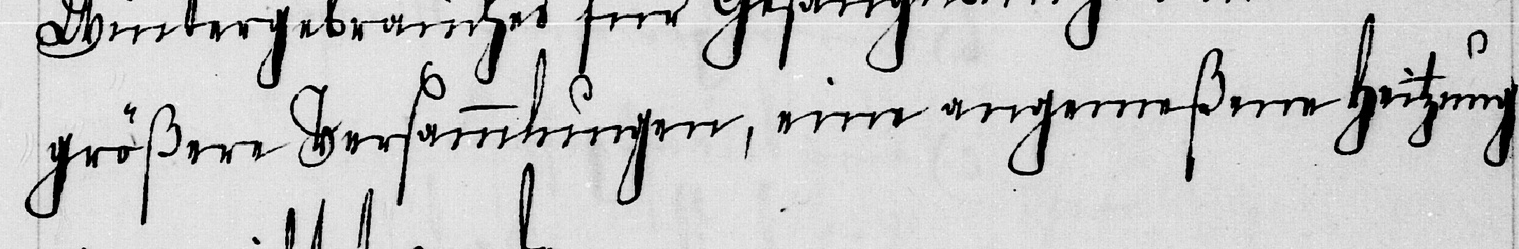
größere Versammlungen, eine angemeßene Heitzung
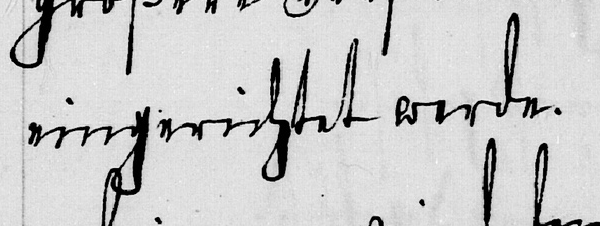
eingerichtet werde.
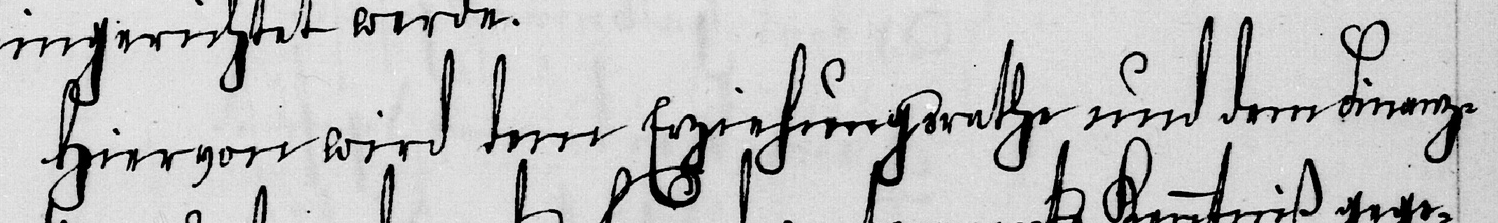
Hiervon wird dem Erziehungsrathe und dem Finanz¬
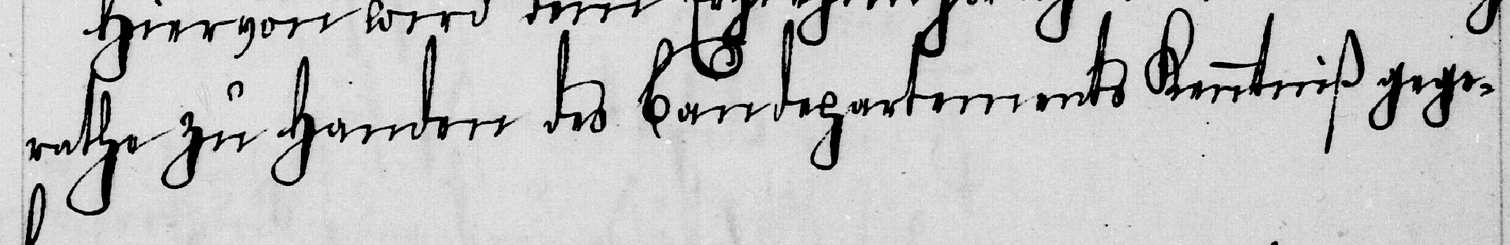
rathe zu Handen des Baudepartements Kenntniß gege¬
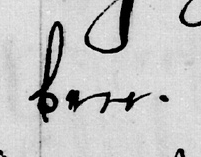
ben.
